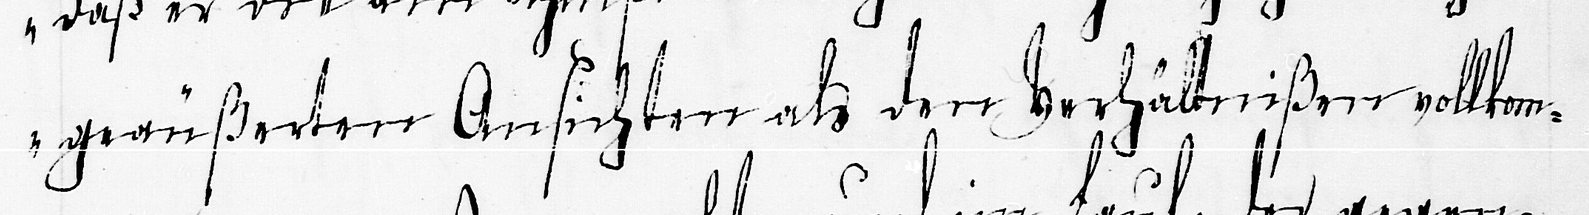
geäußerten Ansichten als den Verhältnißen vollkom¬
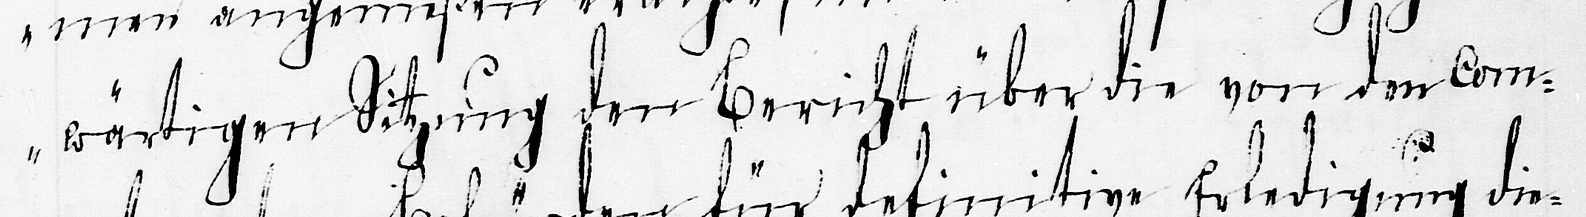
wärtigen Sitzung den Bericht über die von den com¬
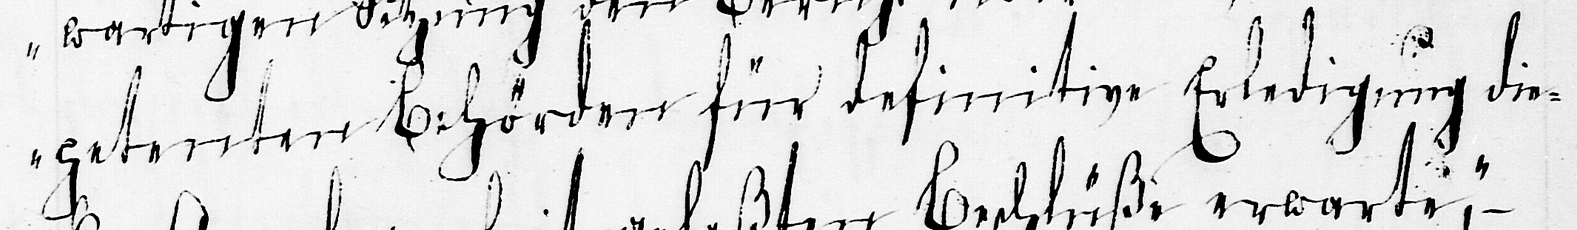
petenten Behörden für definitive Erledigung die¬
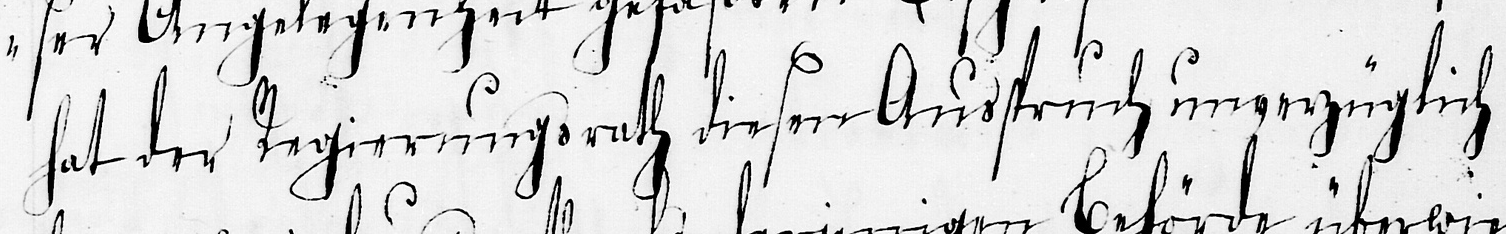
hat der Regierungsrath diesen Ausspruch unverzüglich
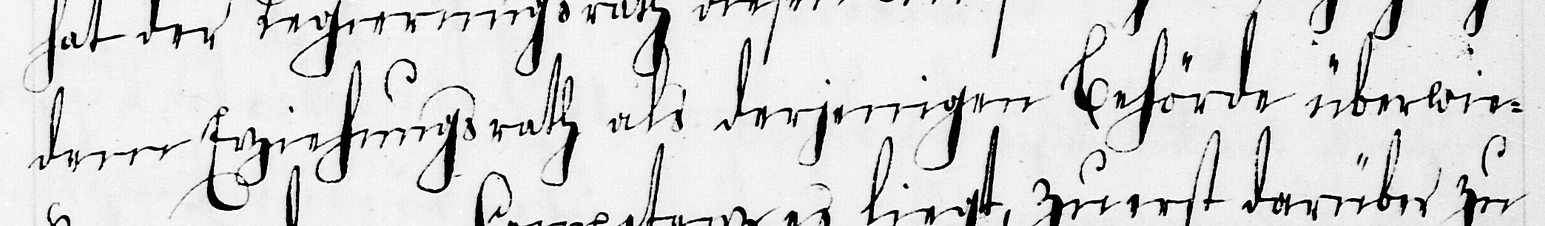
dem Erziehungsrath als derjenigen Behörde überwie¬
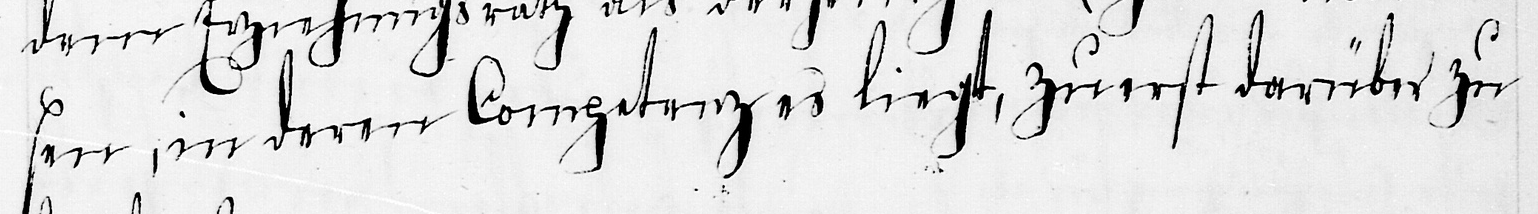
sen, in deren Competenz es liegt, zuerst darüber zu
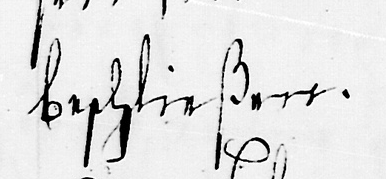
beschließen.
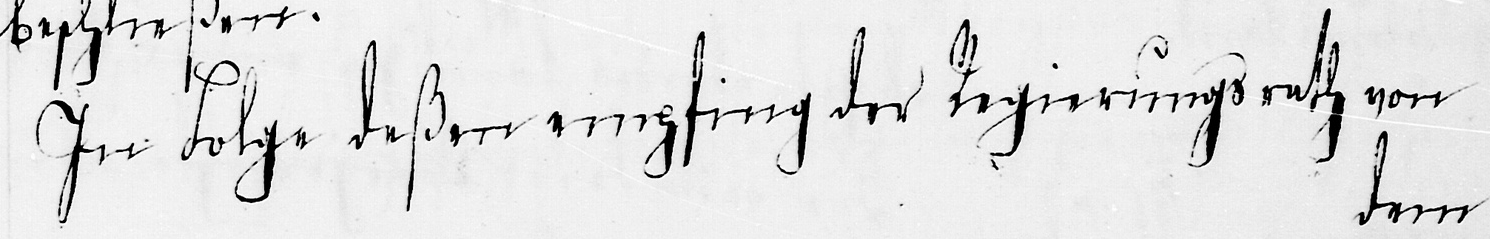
In Folge deßen empfing der Regierungsrath von
